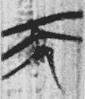而
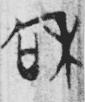和
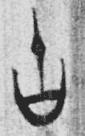古（故）
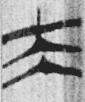夫
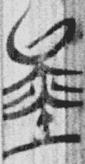○（舜）
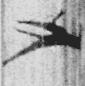之
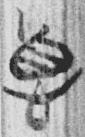惪（德）
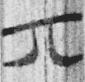亓（其）
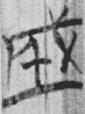城（誠）
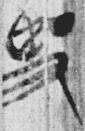○（賢）
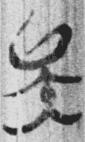矣
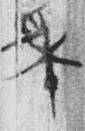○（由）
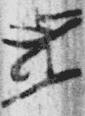者（諸）
